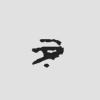不
